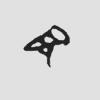見
